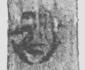百
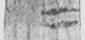二
